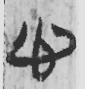心
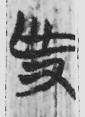拃（作）
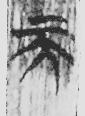天
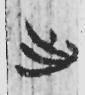出
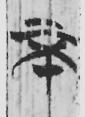不
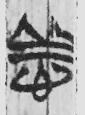恙
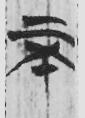不
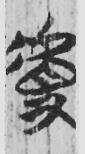虘B
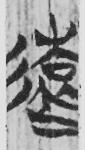遠
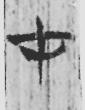才
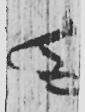氒
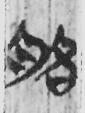胳
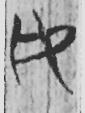女
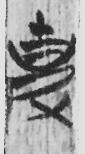尅
